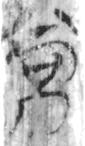常
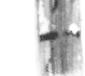一
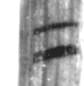二
